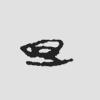是
